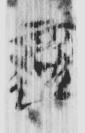獄
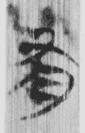有
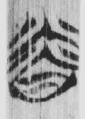{炎自}
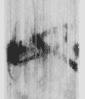女
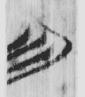勿
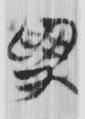受
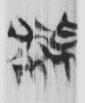{帛㡀}
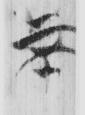不
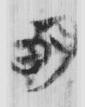明
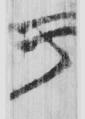于
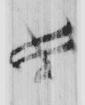民
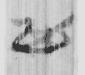𠀠
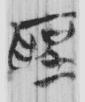聖
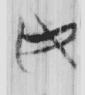女
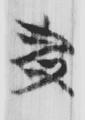寺
